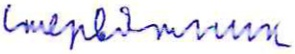стервятник
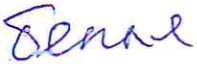бепая
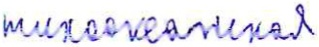тихоокеанская
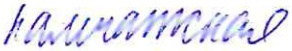камчатская
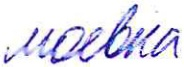моевка
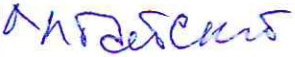алтайскй
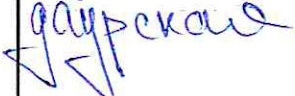даурская
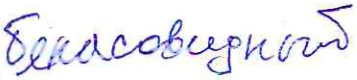бекасовидный
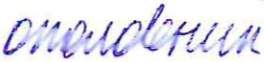ополовник
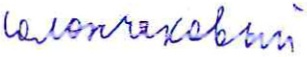солончаковый
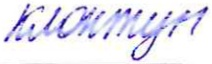клоктун
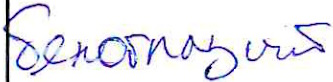белоглазый
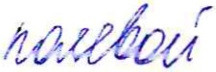полевой
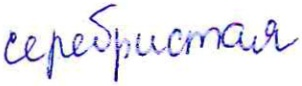серебристая
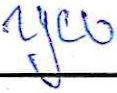гусь
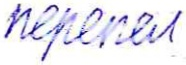перепел
